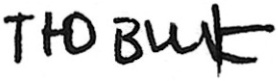тювик
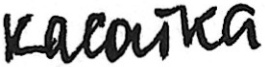касатка
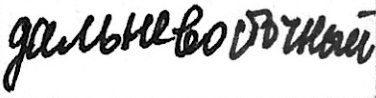дальневосточный
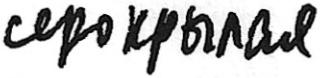серокрылая
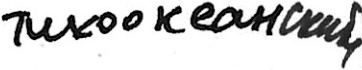тихоокеанский
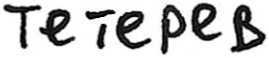тетерев
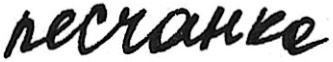песчанка
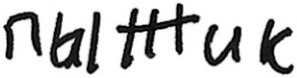пыжик
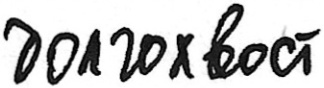долгохвост
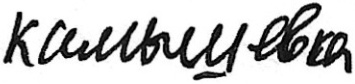камышевка
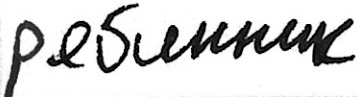ребинник
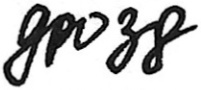дрозд
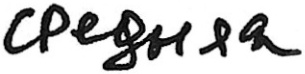средняя
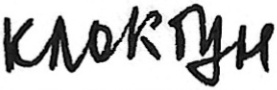клоктун
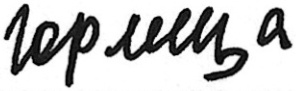горлица
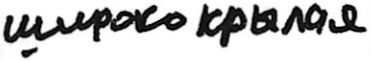ширококрылая
